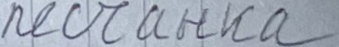песчанка
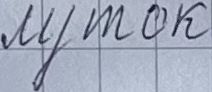луток
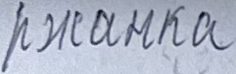ржанка
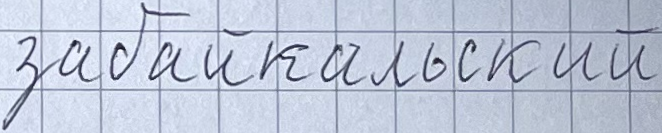забайкальский
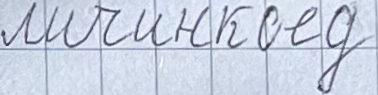личинкоед
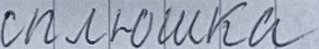сплюшка
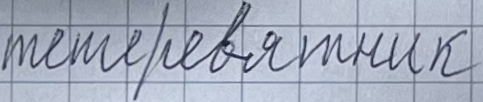тетеревятник
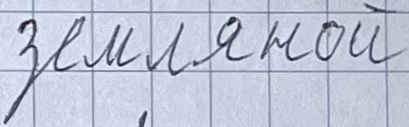земляной
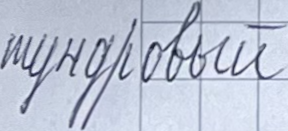тундровый
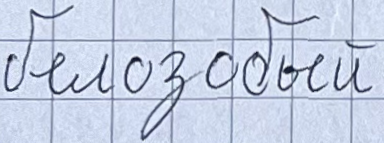белозобый
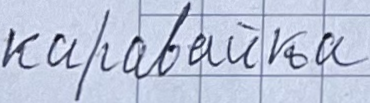каравайка
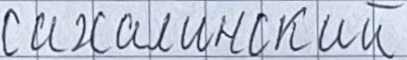сахалинский
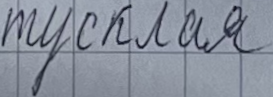тусклая
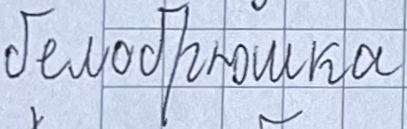белобрюшка
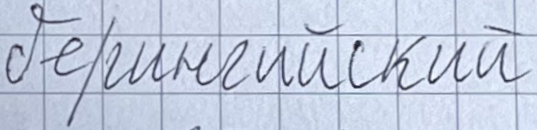берингийский
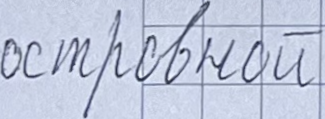островной
